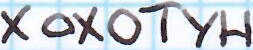хохотун
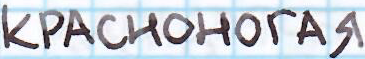красноногая
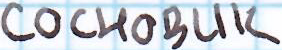сосновик
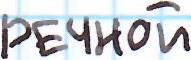речной
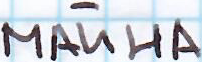майна
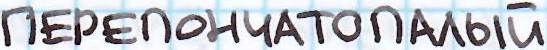перепончатопалый
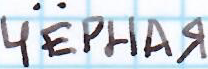чёрная
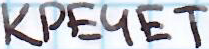кречет
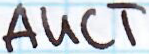аист
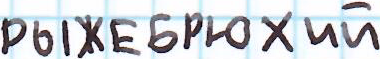рыжебрюхий
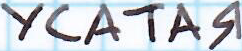усатая
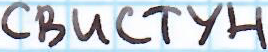свистун
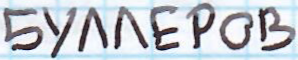буллеров
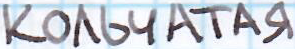кольчатая
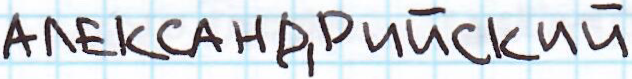александрийский
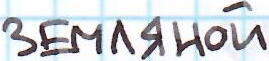земляной
